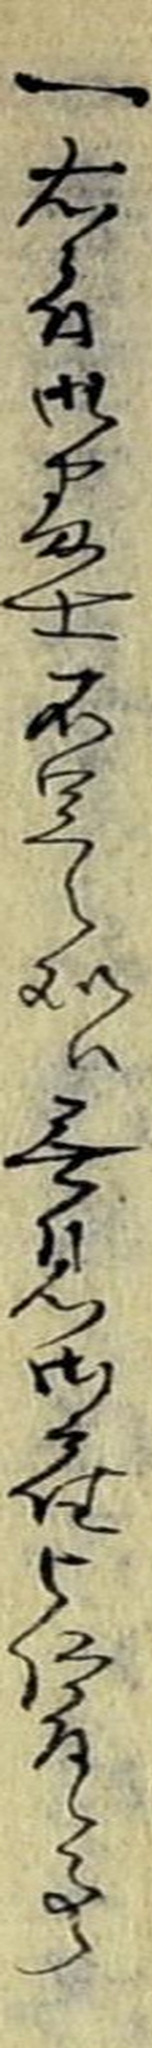一右に付御番士不足之所は無息御雇被仰付候事
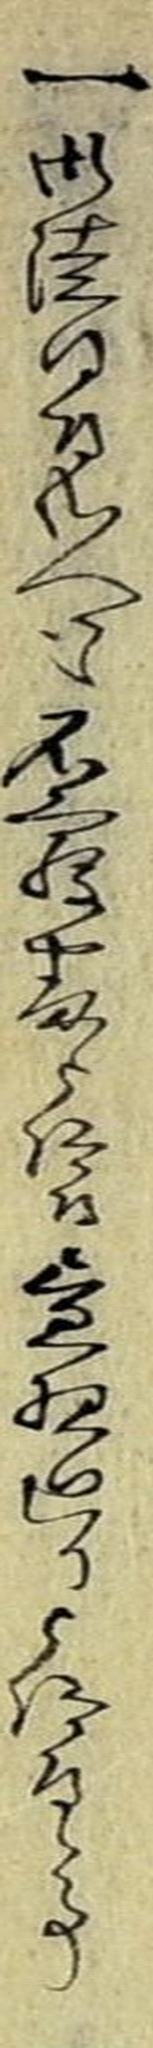一御徒目付弐人つヽ不寝番被仰付昼夜廻り被仰付候事
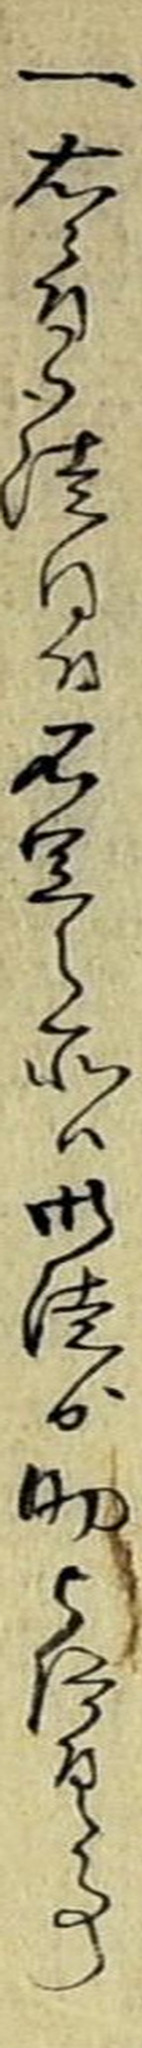一右に付御徒目付不足之所は御徒ゟ助被仰付候事
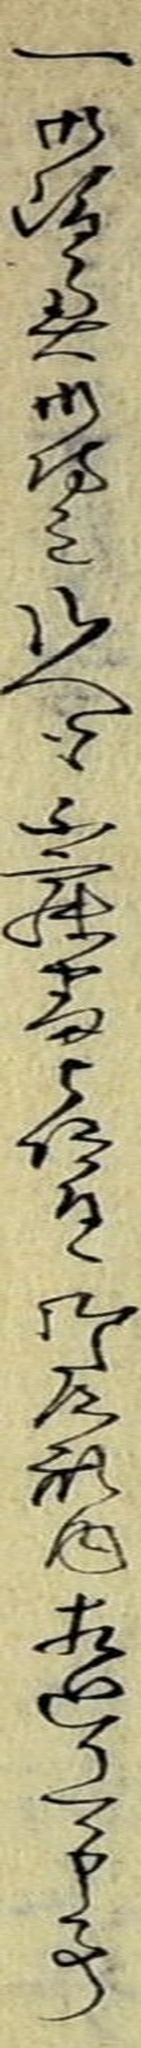一御側奥御坊主弐人つヽ不寝番被仰付候御屋形内相廻り可申事
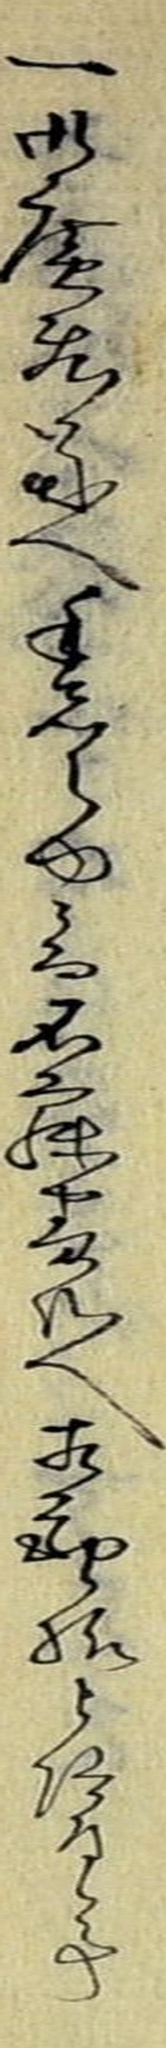一御広敷御用人手先之内に而不寝番弐人相勤候様被仰付候事
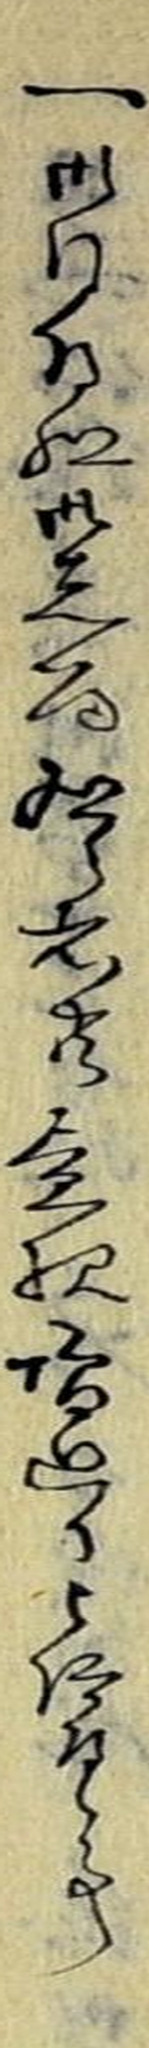一御目付組御先筒組之者共昼夜増廻り被仰付候事
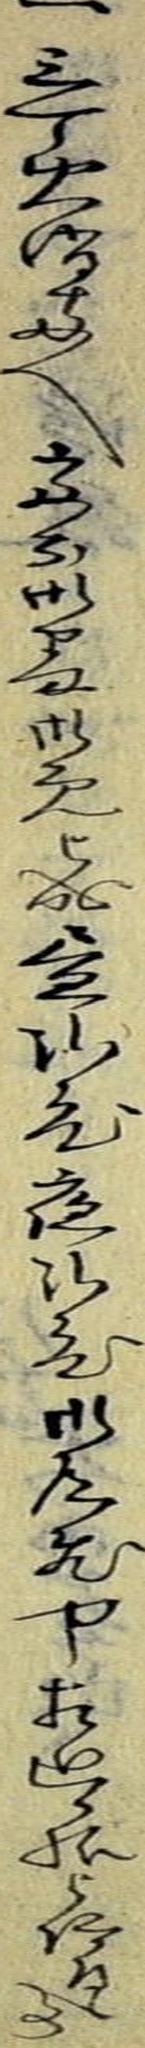一三丁火消両人当分御番御免被成昼弐度夜弐度御屋敷中相廻り候様被仰付候事
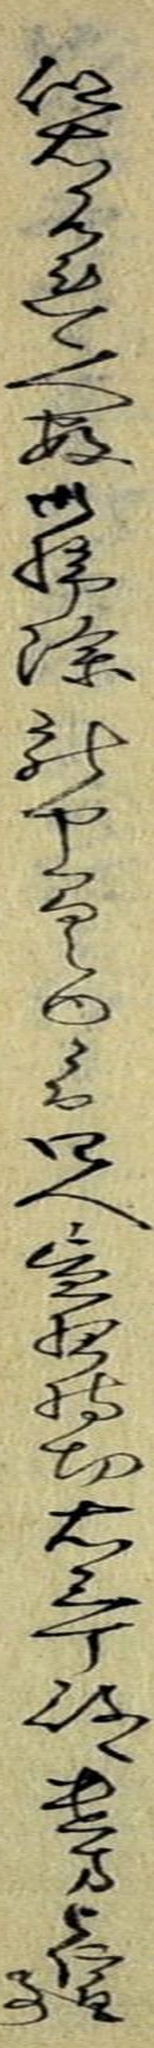但右召連候人数御掃除新中間之内に而四人に昼夜持切右三丁役へ遣方被仰付候事
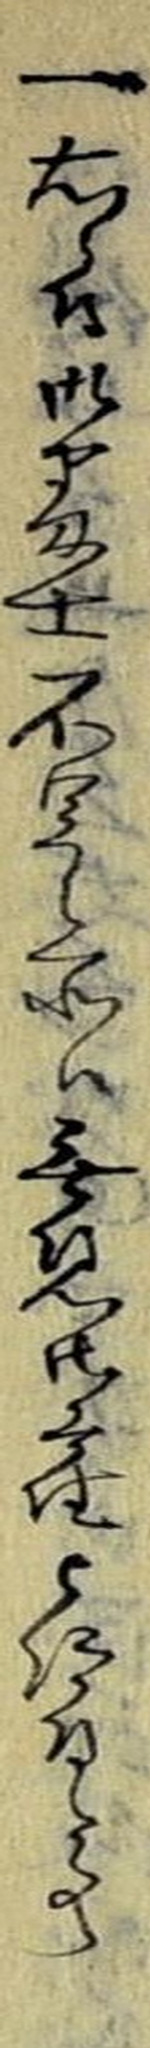一右に付御番士不足之所は無息御雇被仰付候事
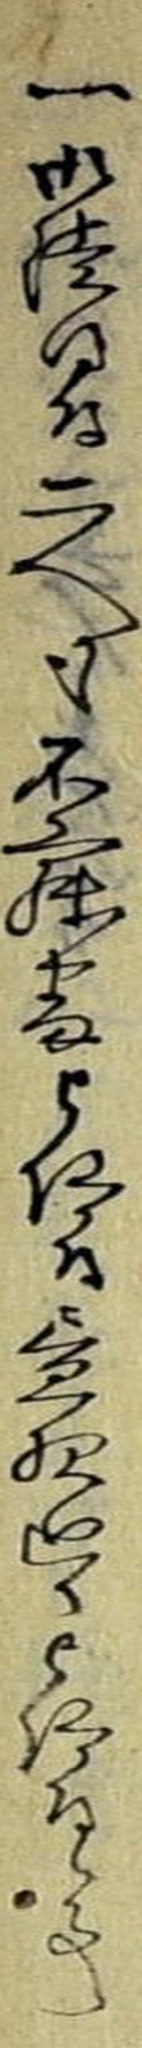一御徒目付二人つヽ不寝番被仰付昼夜廻り被仰付候事
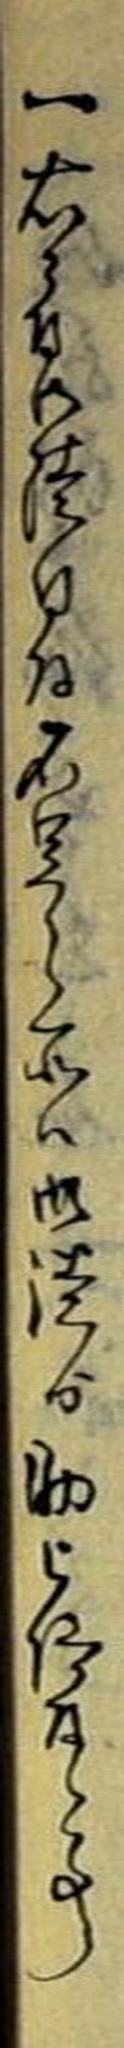一右に付御徒目付不足之所は御徒ゟ助被仰付候事
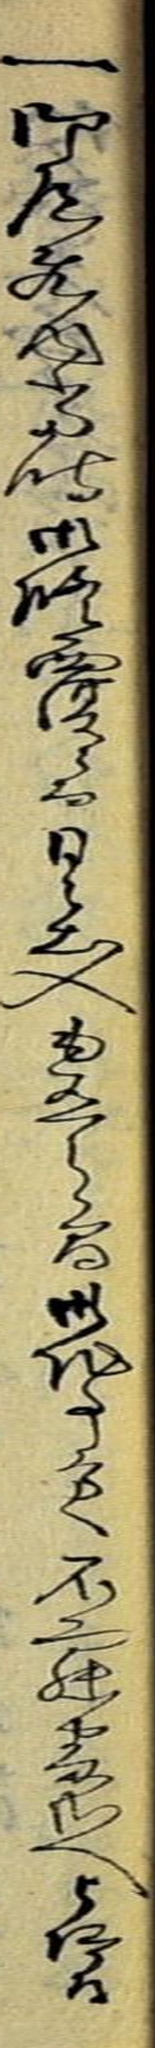一御屋敷内当時御修覆に而日々出入も有之候間御作事方へ不寝番弐人被仰付
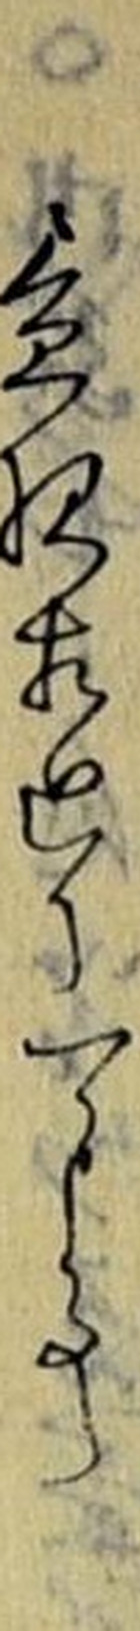昼夜相廻り可申事
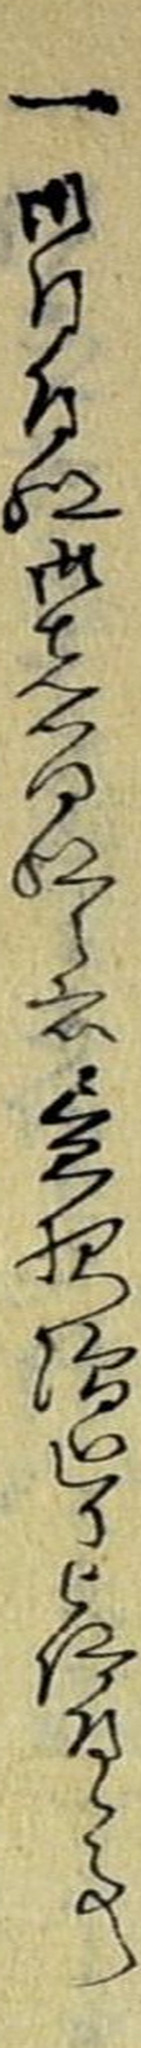一御目付組御先筒組之者昼夜増廻り被仰付候事
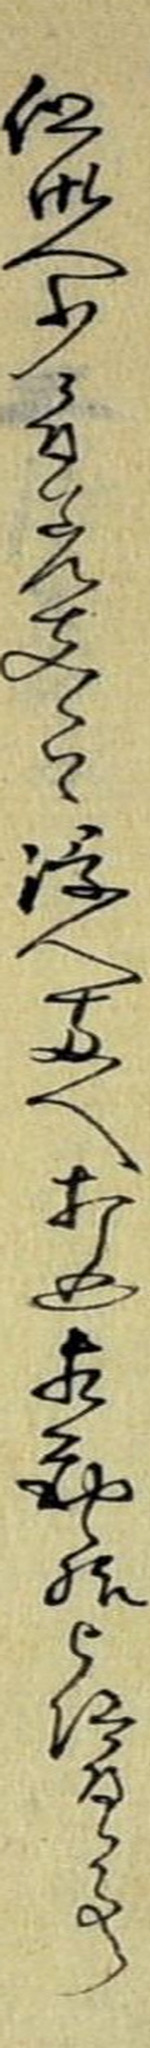但御人少に付差支候はヽ浮人両人打込相勤候様被仰付候事
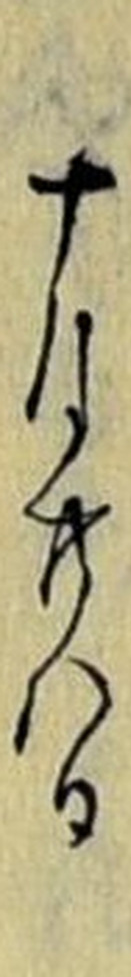十月廿八日
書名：命令之部 四
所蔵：福井県文書館 Fukui Prefectural Archives
